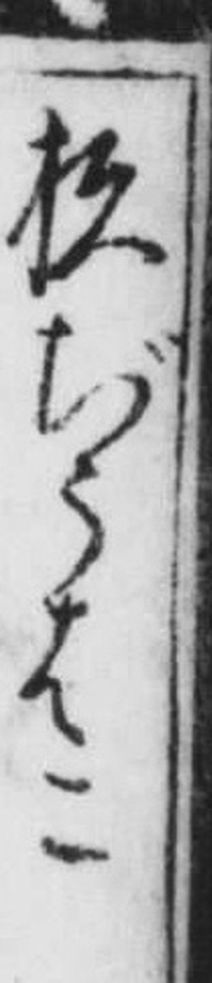杦ぢうはこ
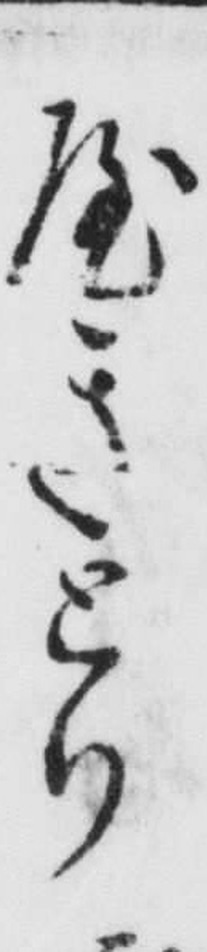やきとり
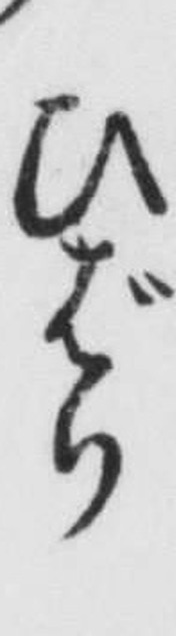ひばり
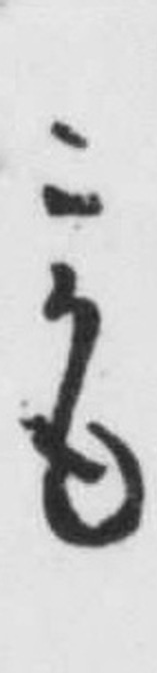こかも
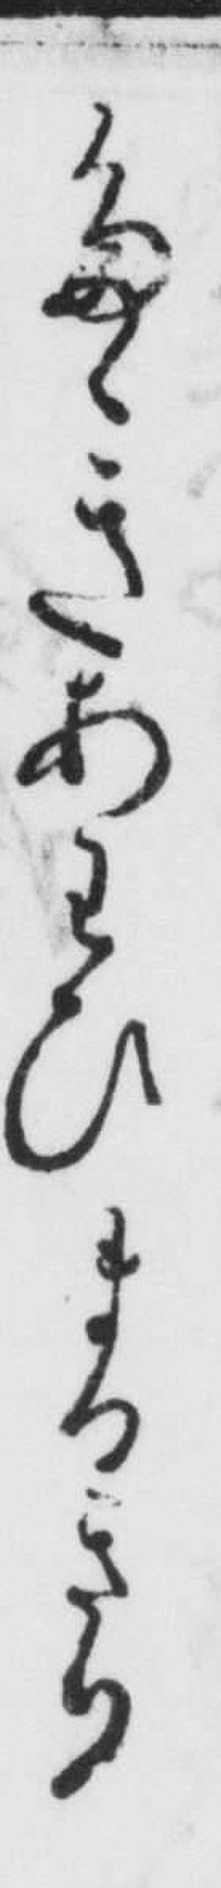たゝきあわひまるきり
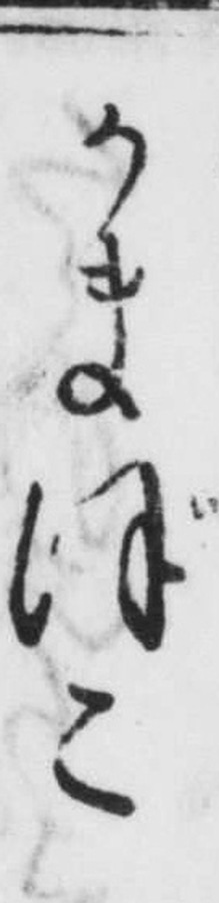かまぼこ
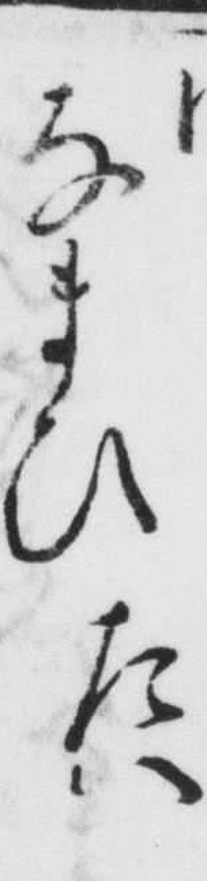なまひたい
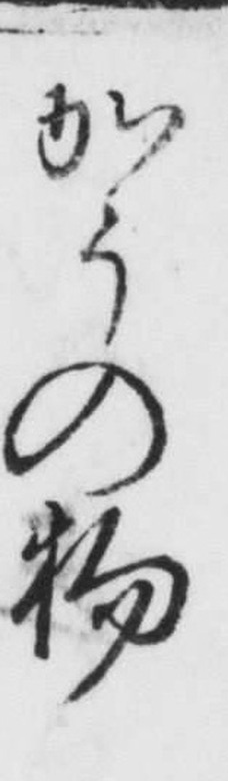かうの物
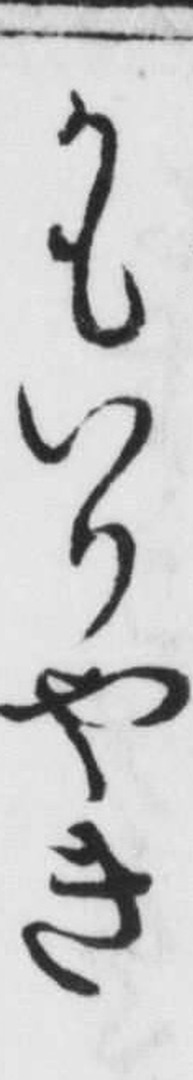かもいりやき
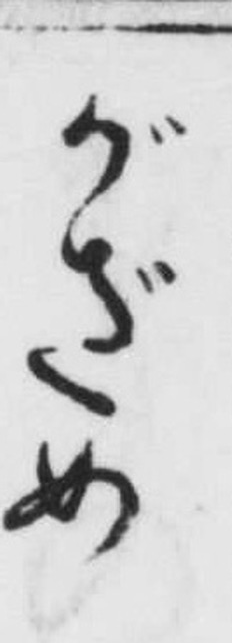がだめ
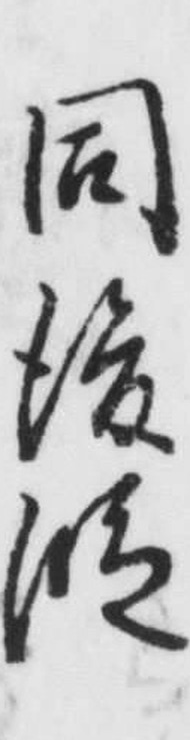同後段
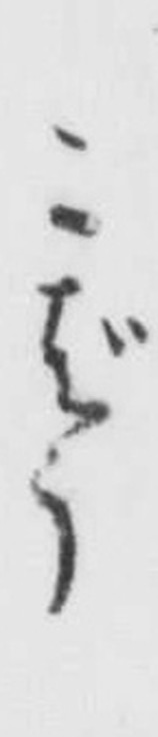こばう
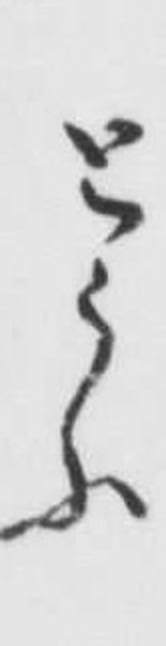とうふ

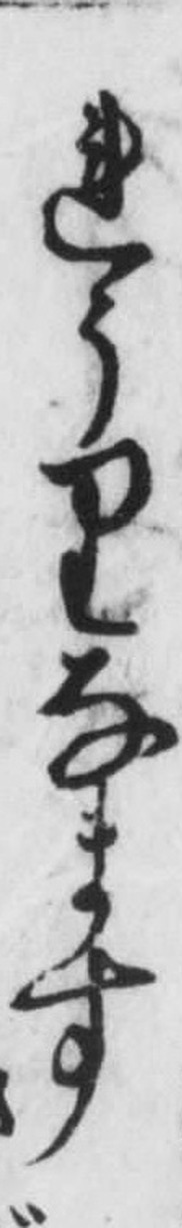れうりなます汁
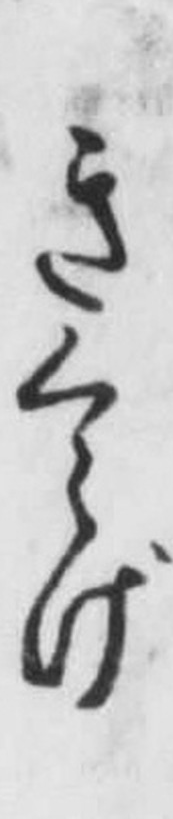きくらげ
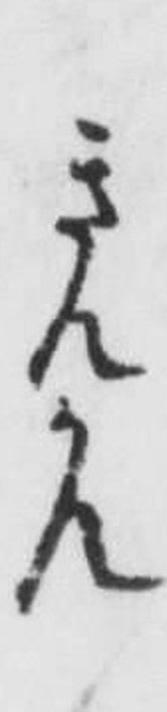きんかん
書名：料理切形秘伝抄
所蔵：大阪府立大学学術情報センター 国文学研究資料館
